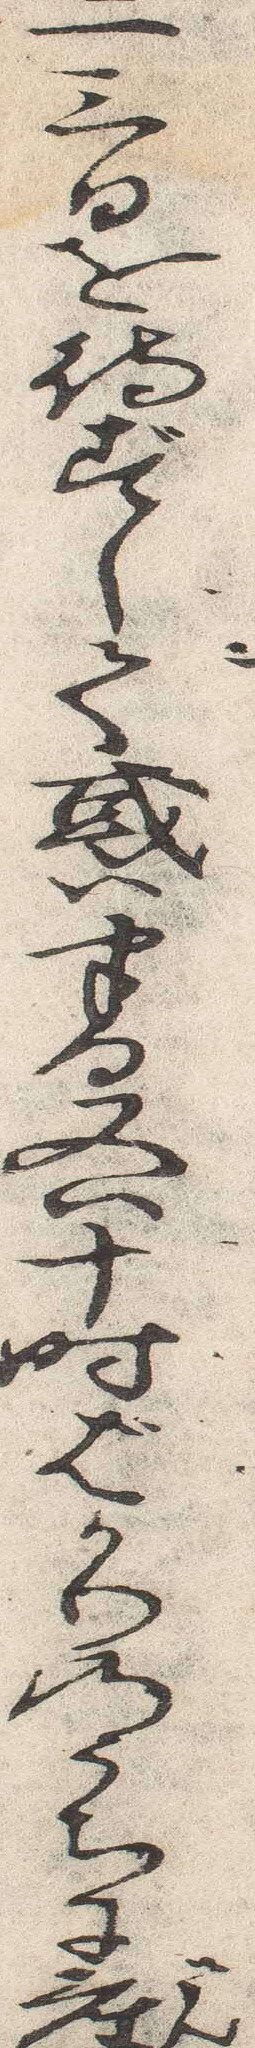二三日を待ずして或は半日又は十時ばかりのうちに産
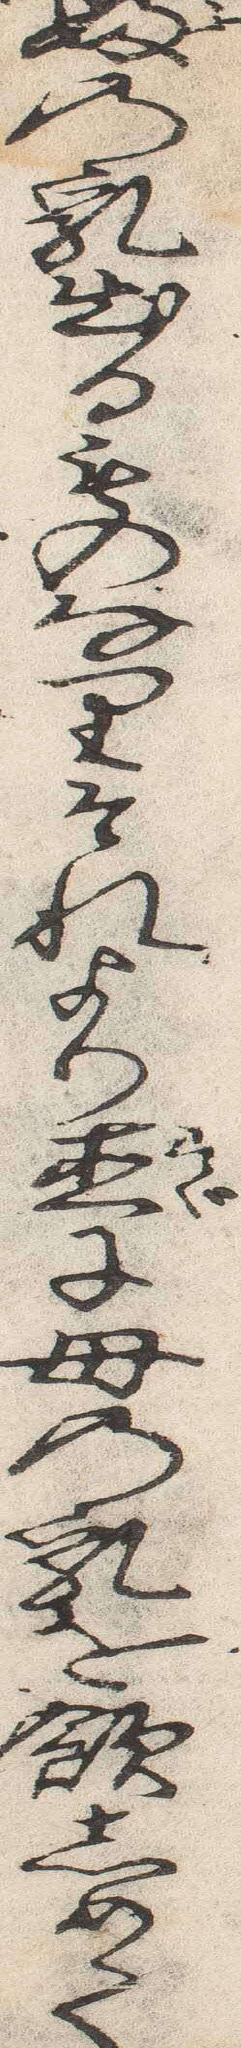婦の乳出るものなりそれより直に母の乳を飲しめて
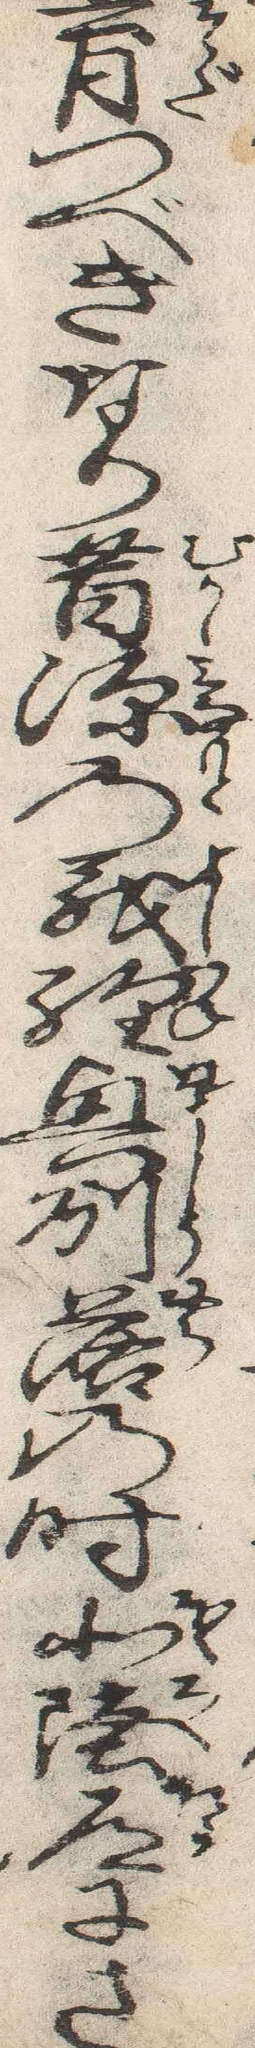育つべきなり昔源の義経奥州落の時北陸道にさ
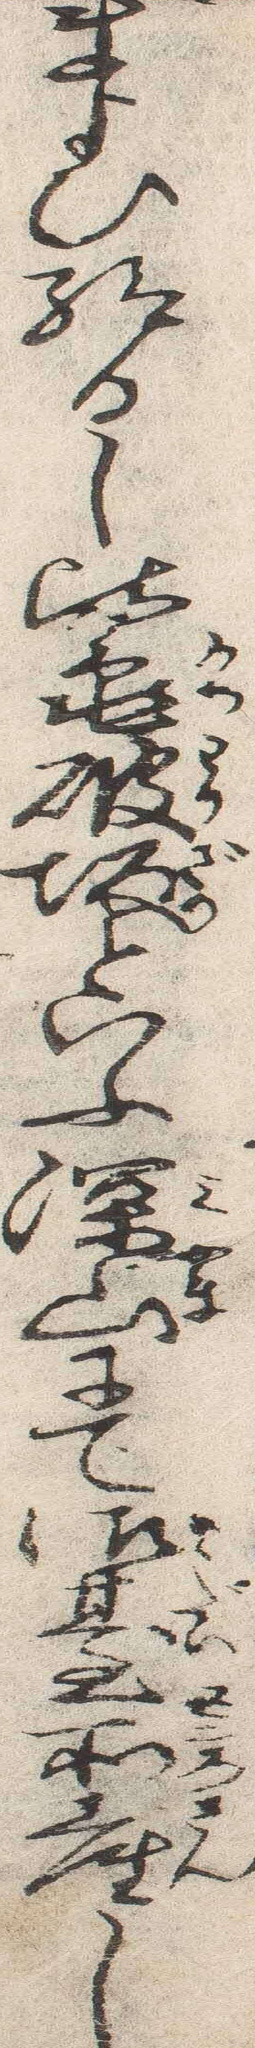まよひ給ひし頃亀破坂といふ深山にて御䑓所産し
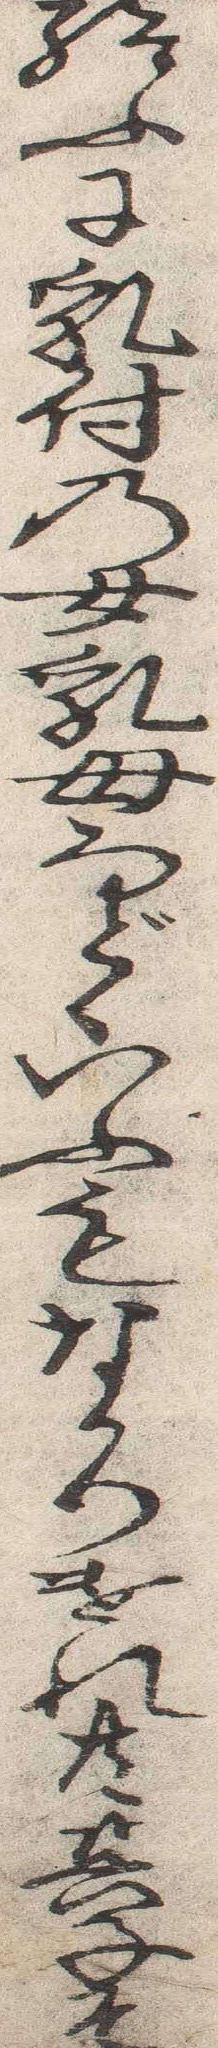給ふに乳付の女乳母などゝいふもなかりけれ共其子そ
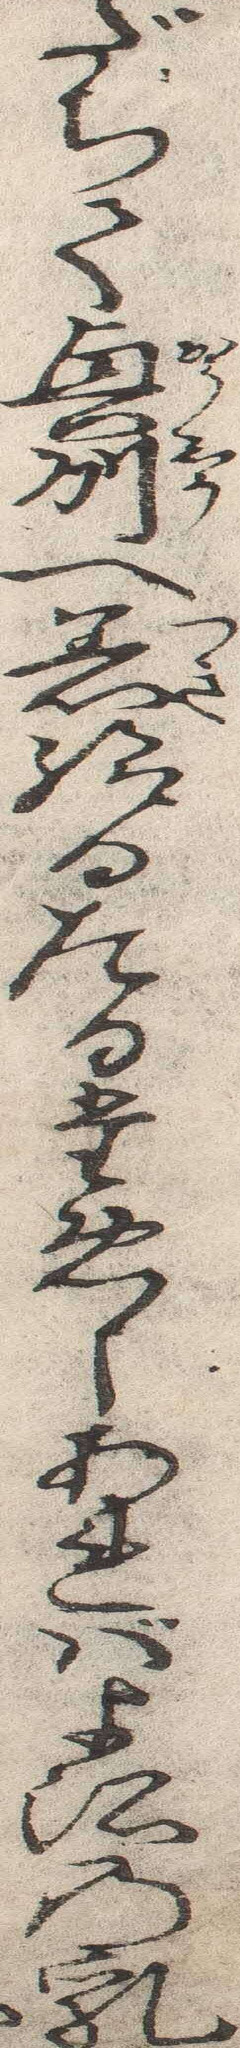だちて奥州へ着給ひたるためしあればよその乳
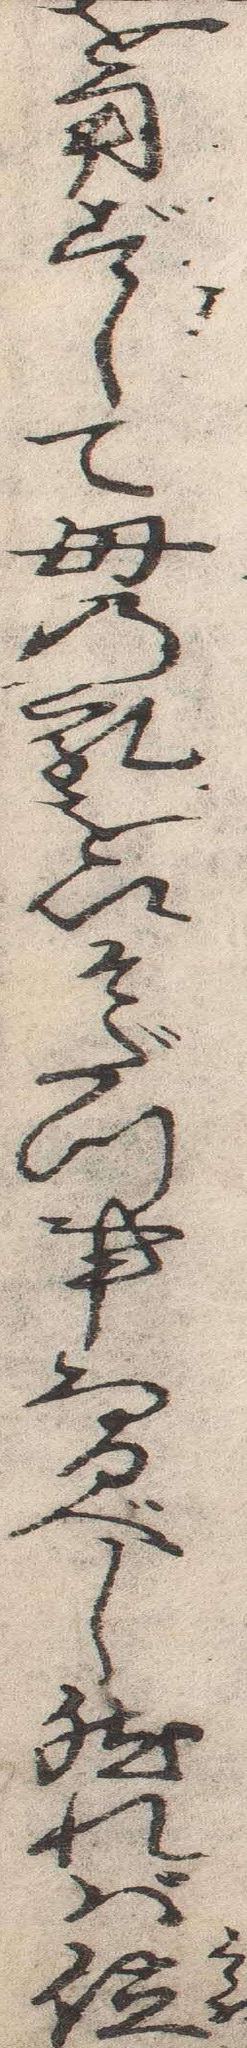を用ずして母の乳を以そだつ事なるべし然れば位

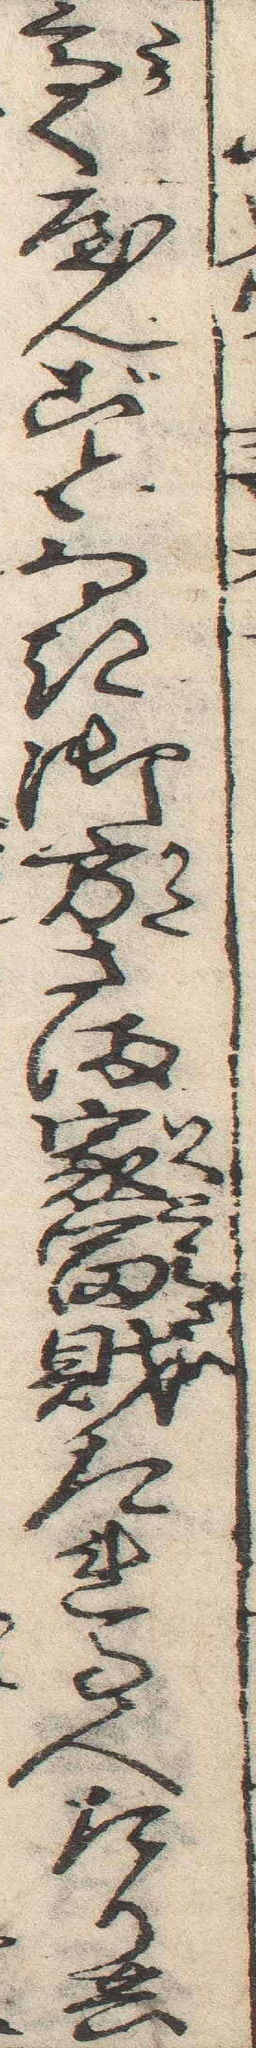高くやんごとなき御方さま家富財たれる人たり共
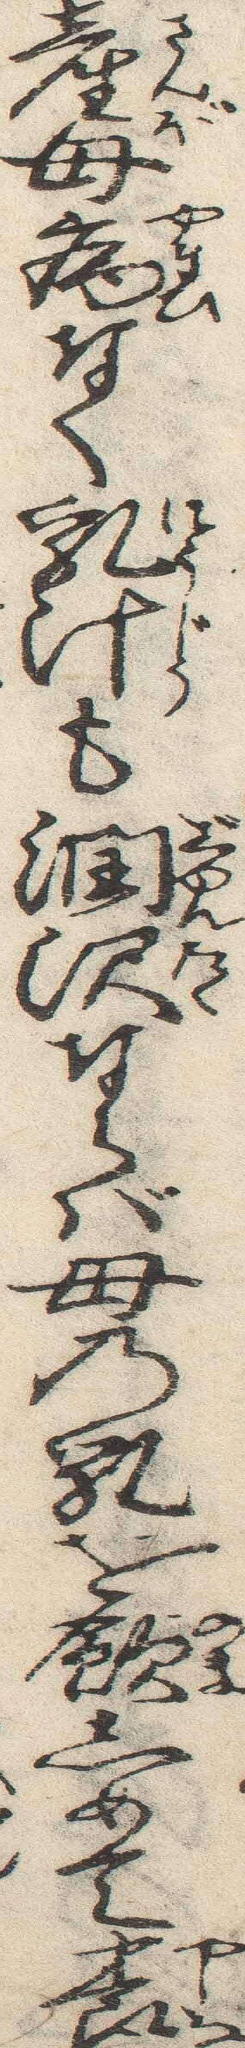産母病なく乳汁も潤沢ならば母の乳を飲しめて養
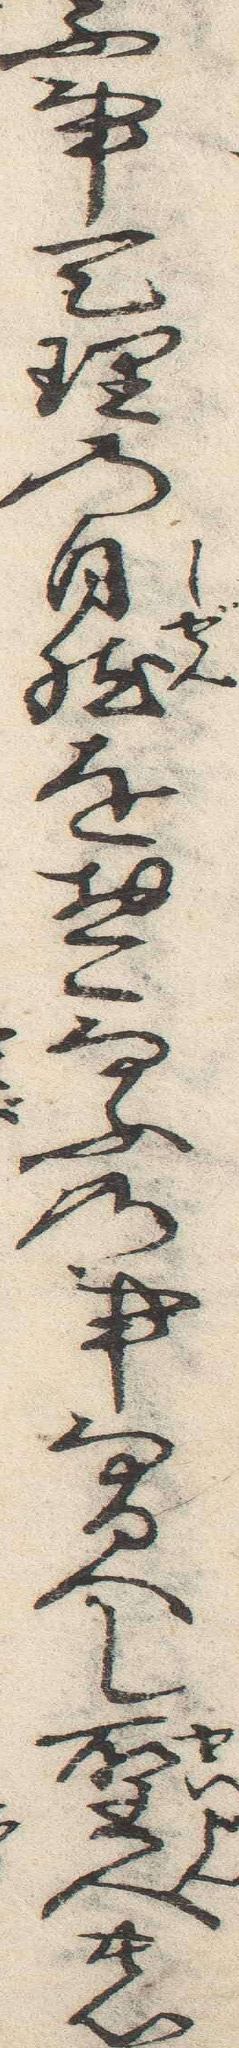ふ事天理の自然をおこなふの事なるへし聖人の
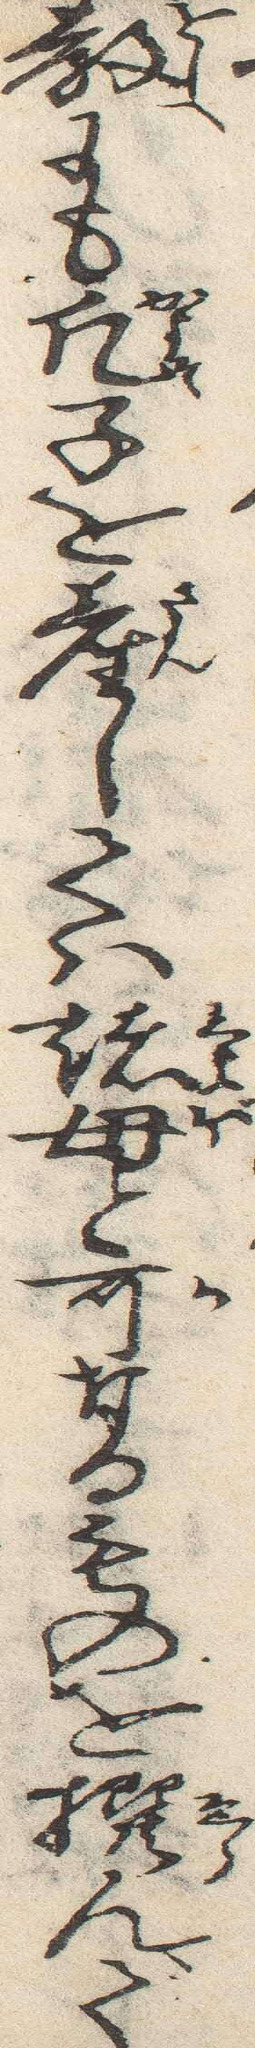教にも凢子を産しては諸母と可なるものを撰んで
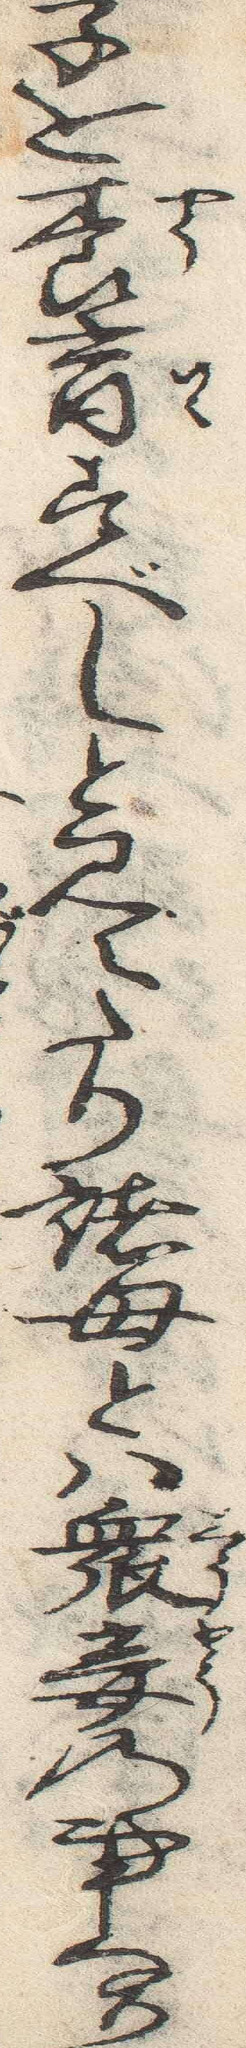子を養育すべしと見えたり諸母とは衆妾の事なり
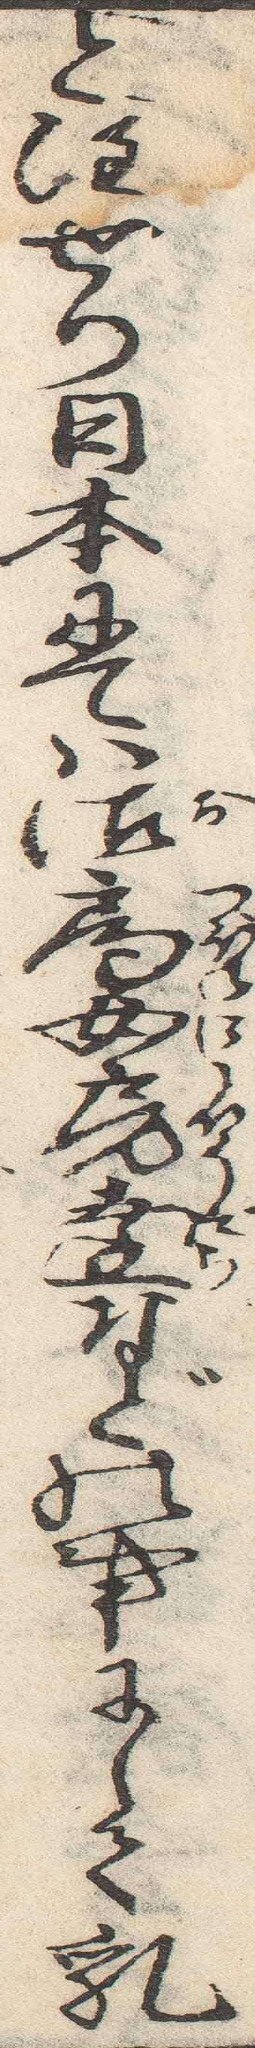と注せり日本にては御局女房達などの事にして乳
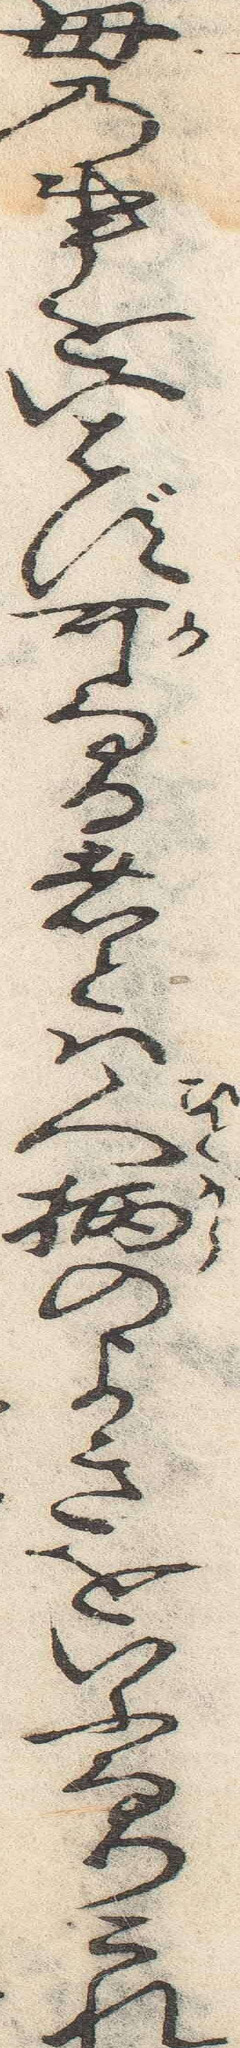母の事をいはず可なる者とは人柄のよきをいふなりこれ
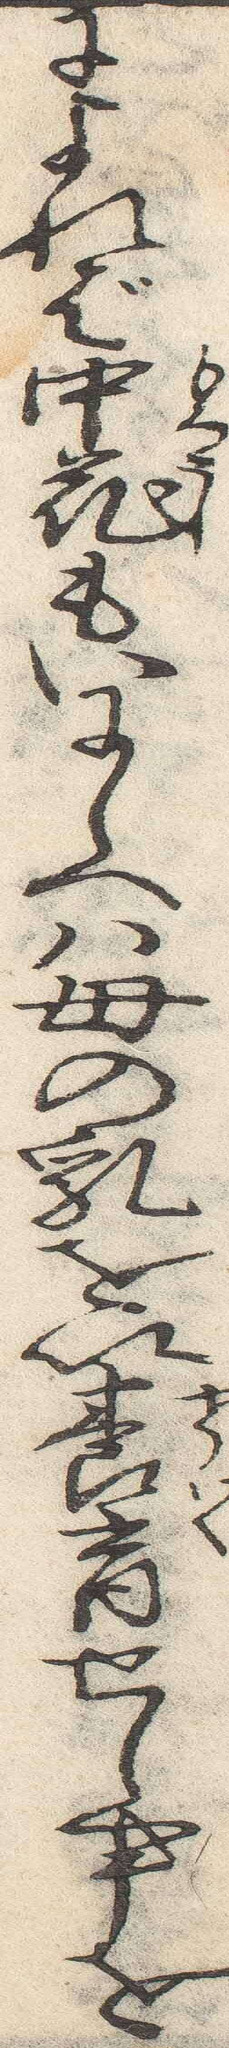によれば中花もいにしへは母の乳を以養育せし事を
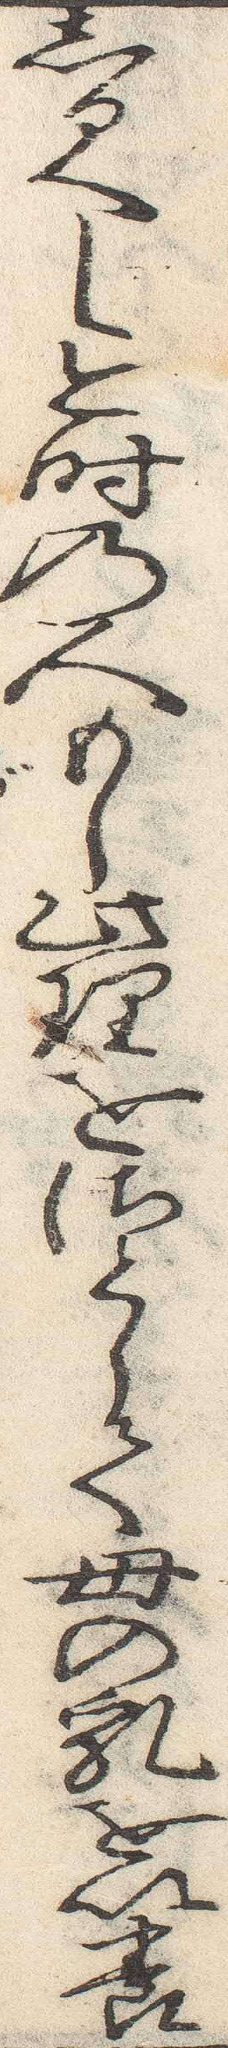しるへしと時の人もし此理をさとして母の乳を以養
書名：小児必用養育草
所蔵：東京学芸大学附属図書館 国文学研究資料館
